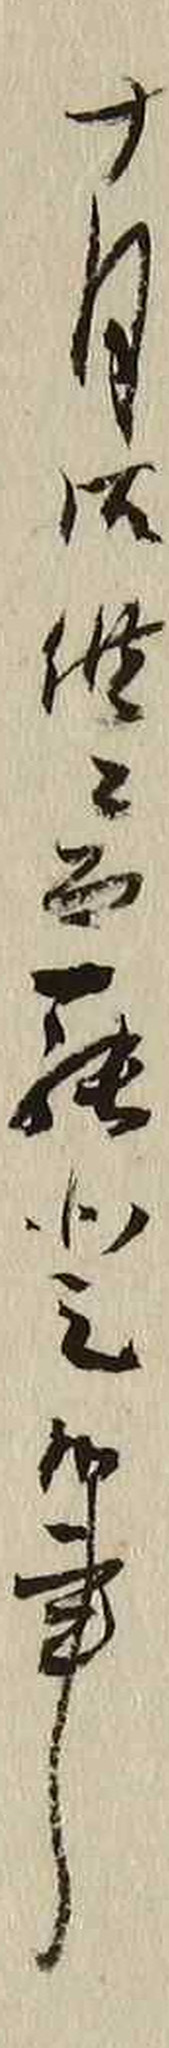十月御供ニ而罷登候事
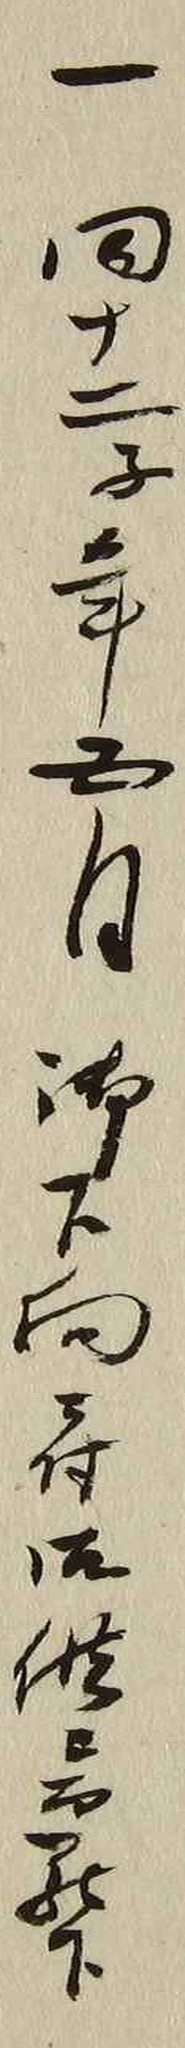一同十二子年五月御下向ニ付御供ニ而罷下
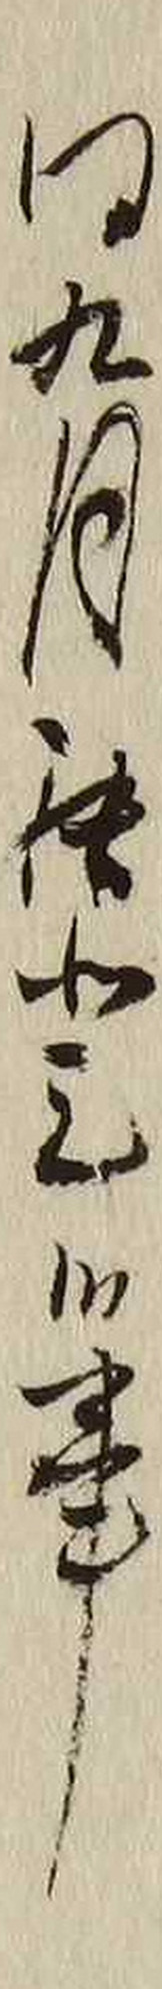同九月罷登候事
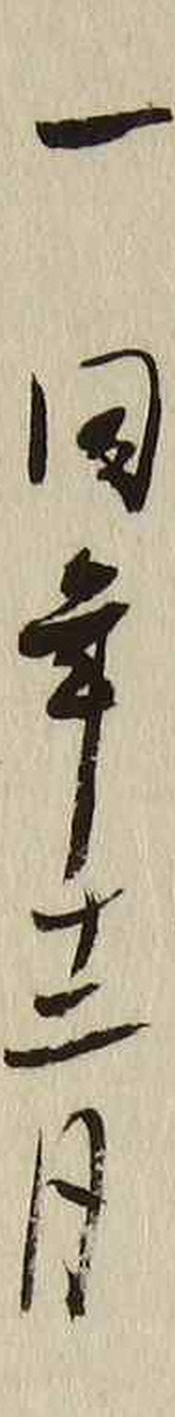一同年十二月
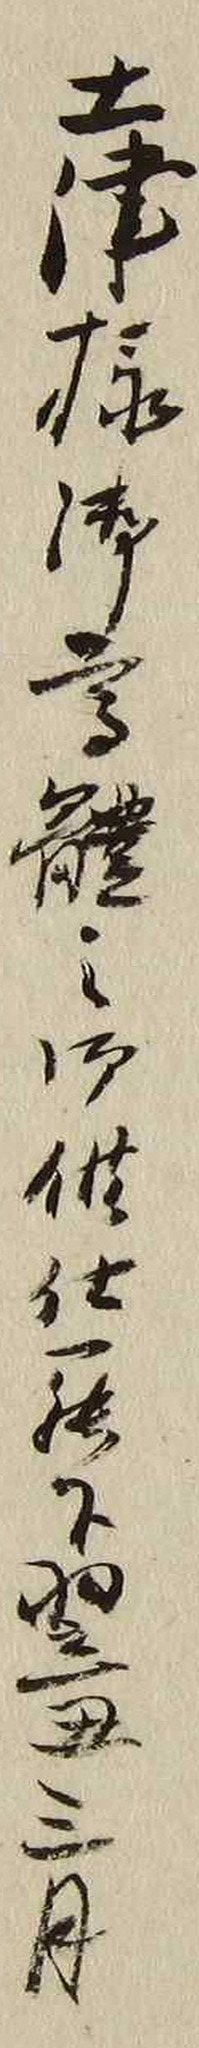土津様御尊体之御供仕罷下翌丑三月
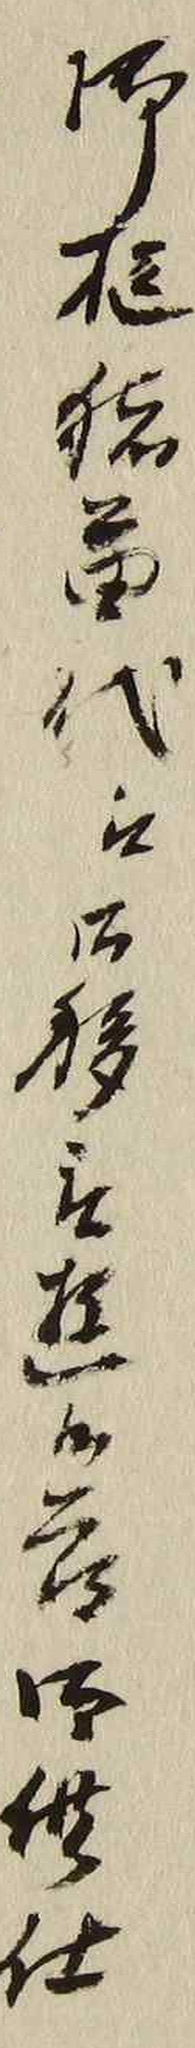御柩猪苗代江御移被遊候節御供仕
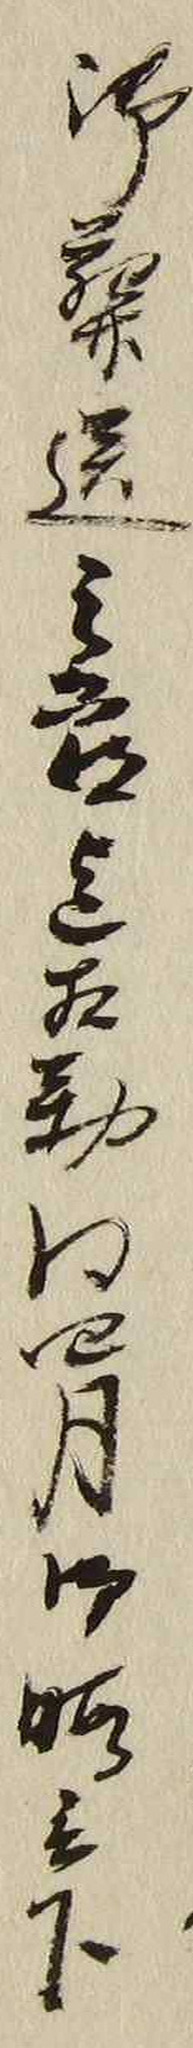御葬送之節迄相勤同四月御暇被下
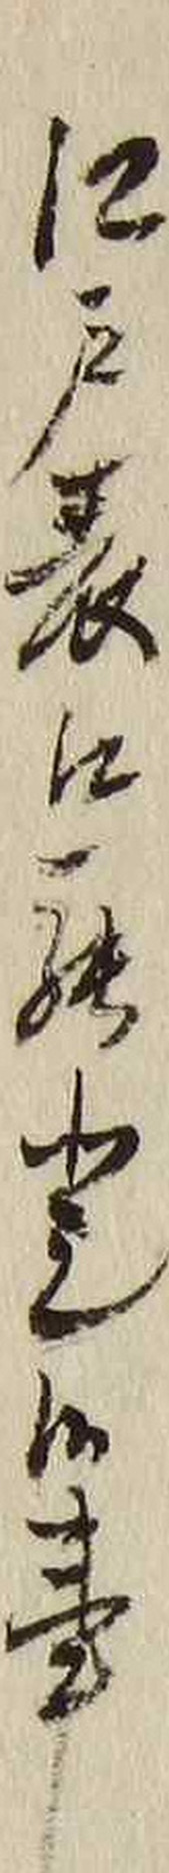江戸表江罷登候事
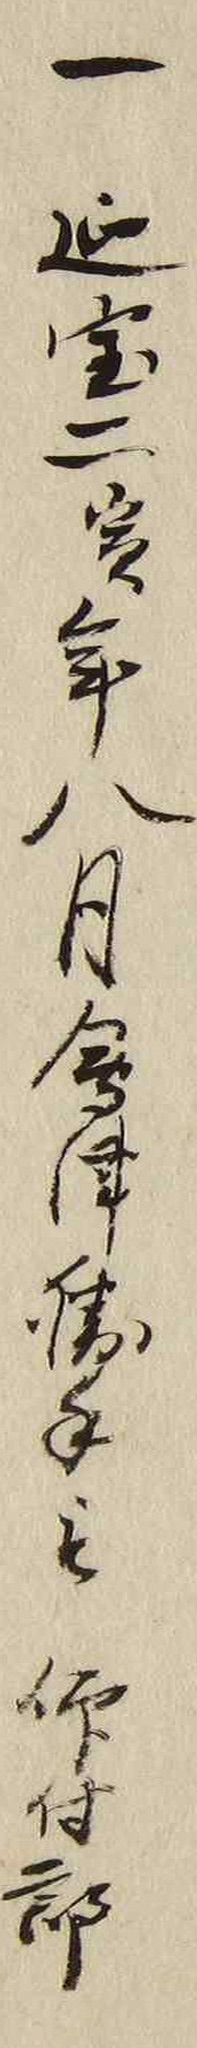一延宝二寅年八月会津勝手被仰付郎

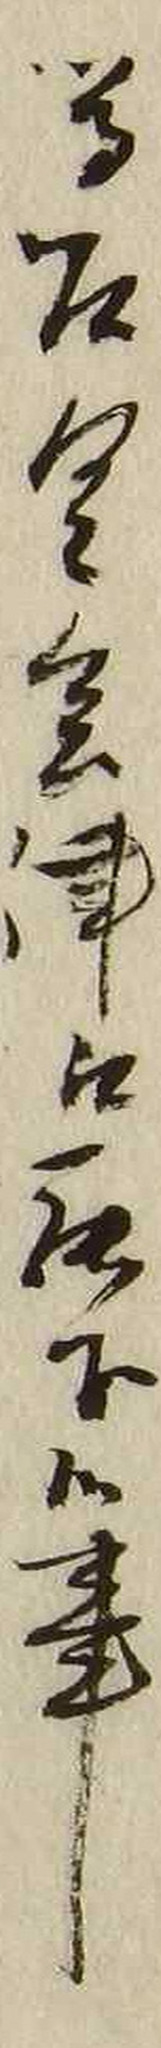等召具会津江罷下候事
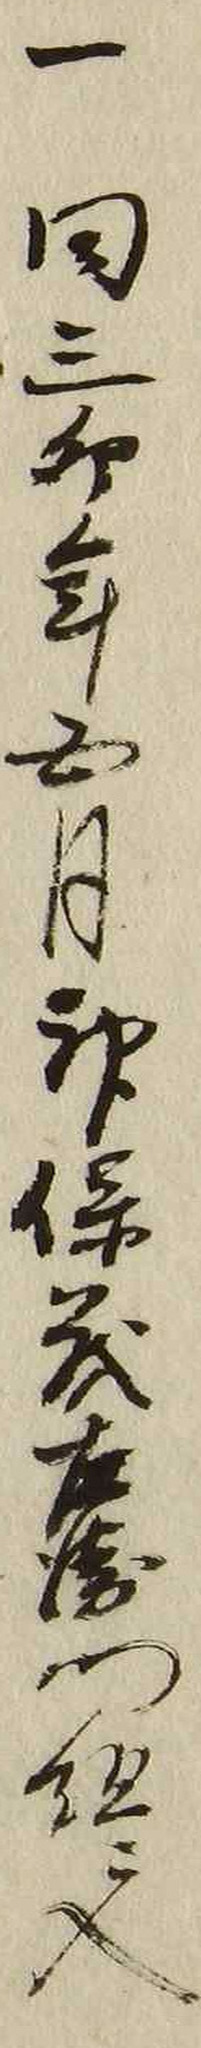一同三卯年五月神保茂左衛門組ニ入
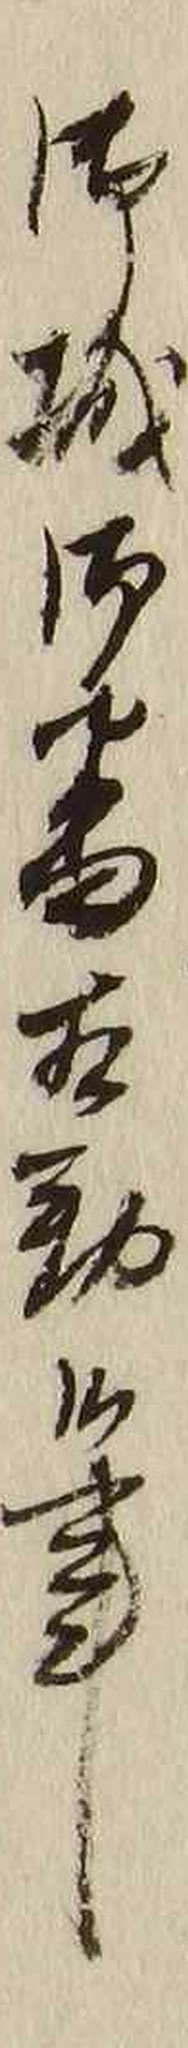御城御番相勤候事
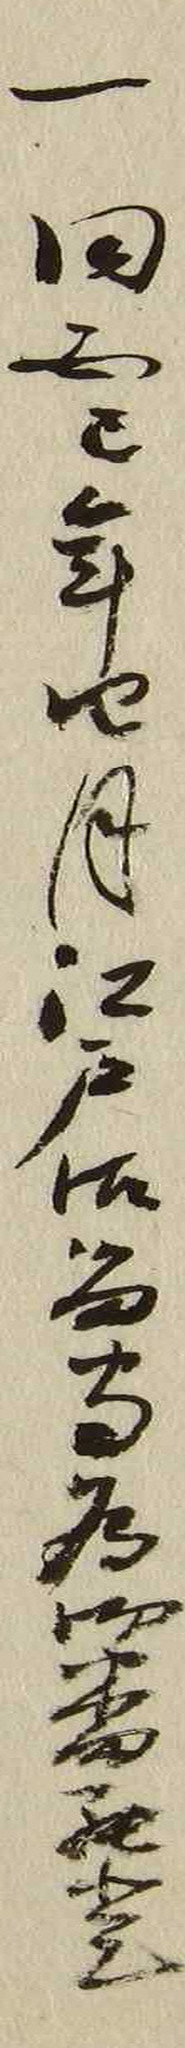一同五巳年四月江戸御留守為御番罷登
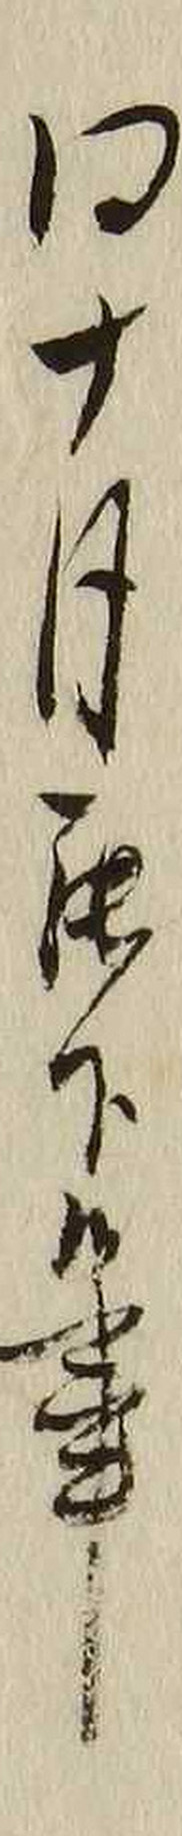同十月罷下候事
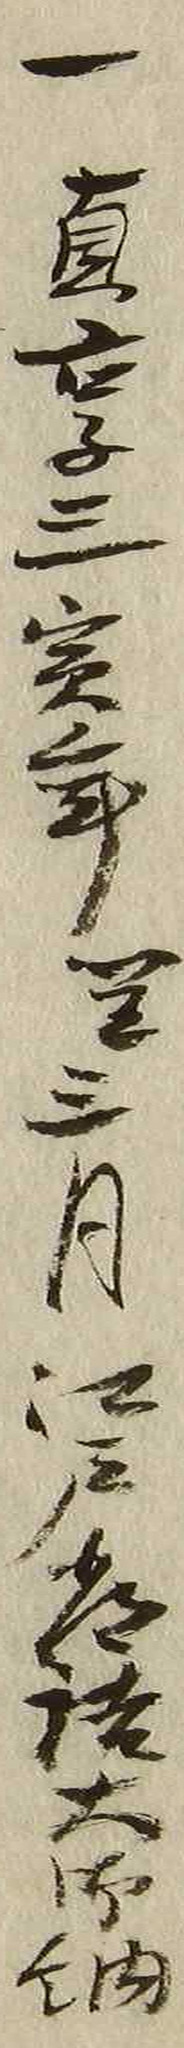一貞享子三寅年閏三月江戸常詰大御納
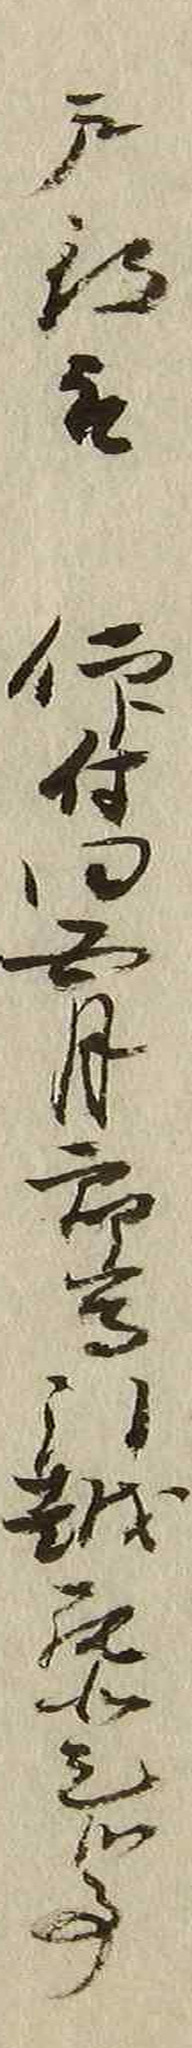戸役被仰付同五月郎等引越罷登候事
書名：諸士系譜　巻之345　も之部1
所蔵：会津若松市立会津図書館
